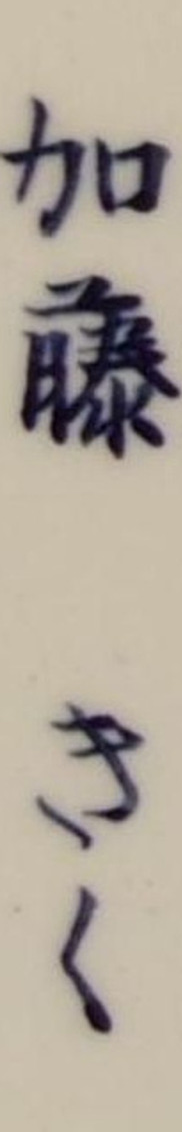加藤きく
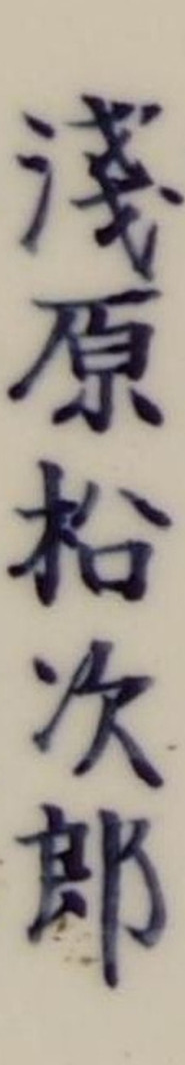浅原松次郎
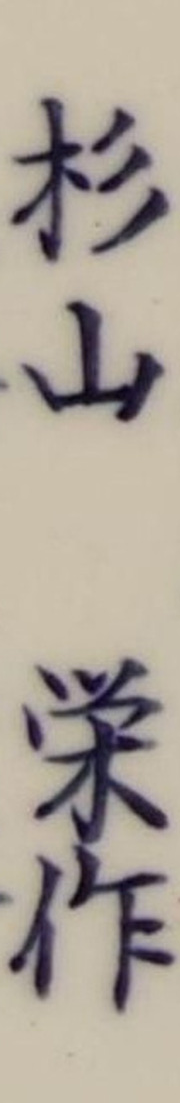杉山栄作
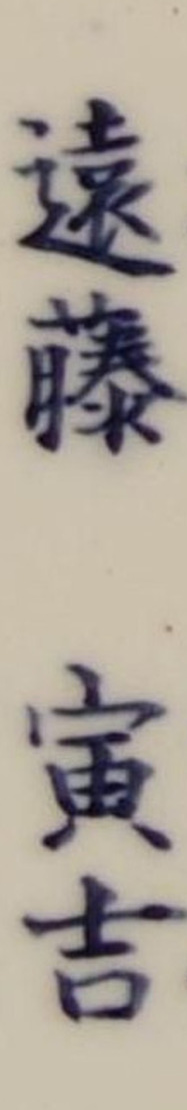遠藤寅吉

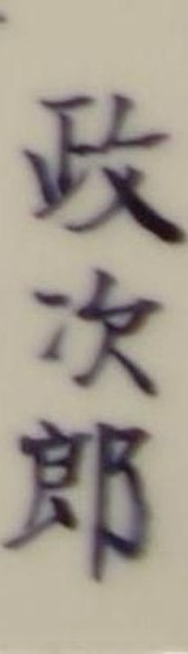政次郎
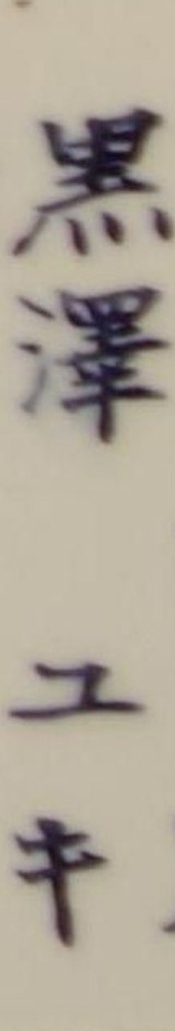黒澤ユキ
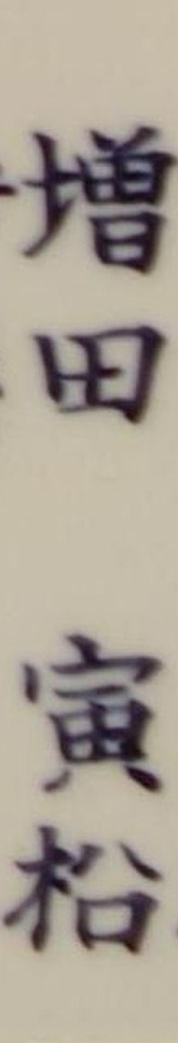増田寅松
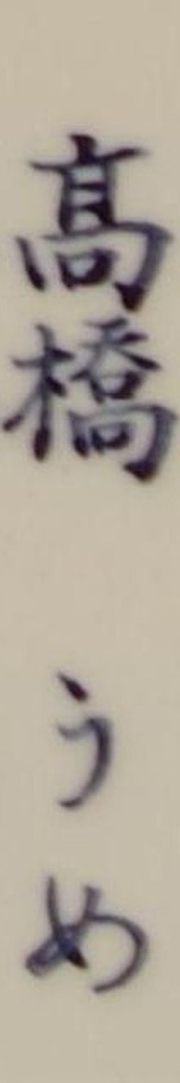高橋うめ
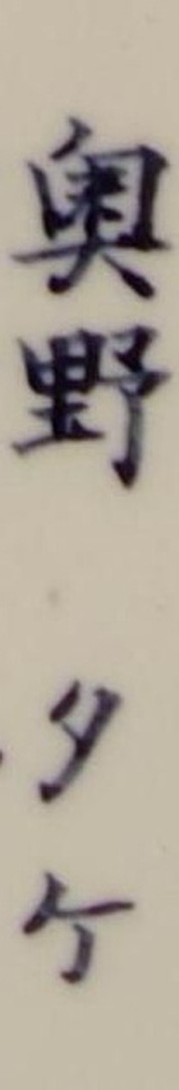奥野夕ケ
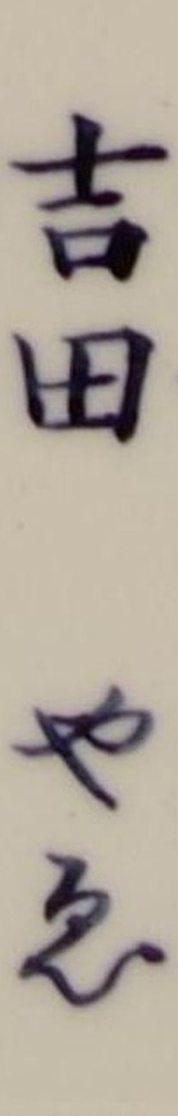吉田やゑ
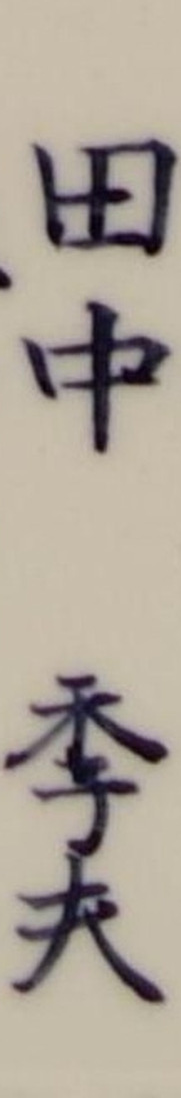田中季夫
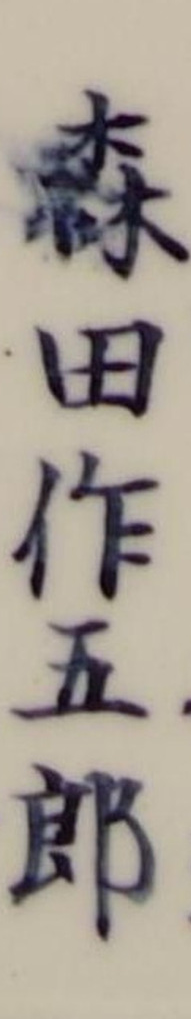森田作五郎
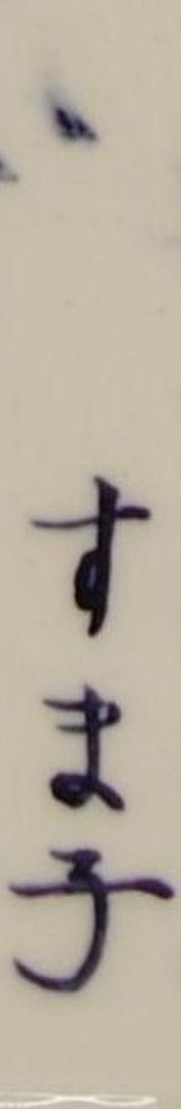すま子
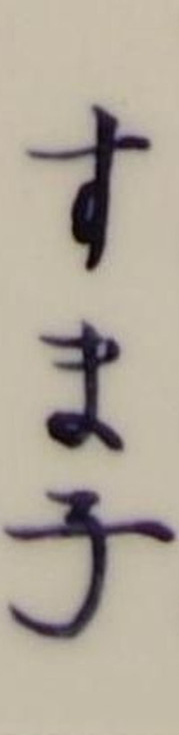すま子
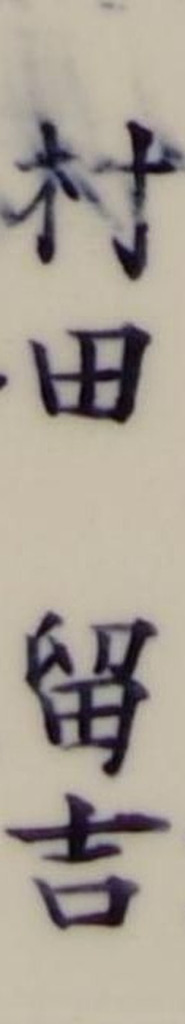村田留吉
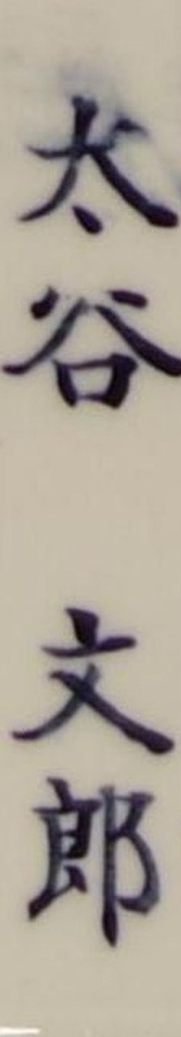太谷文郎
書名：M~S
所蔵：高野山金剛峯寺
